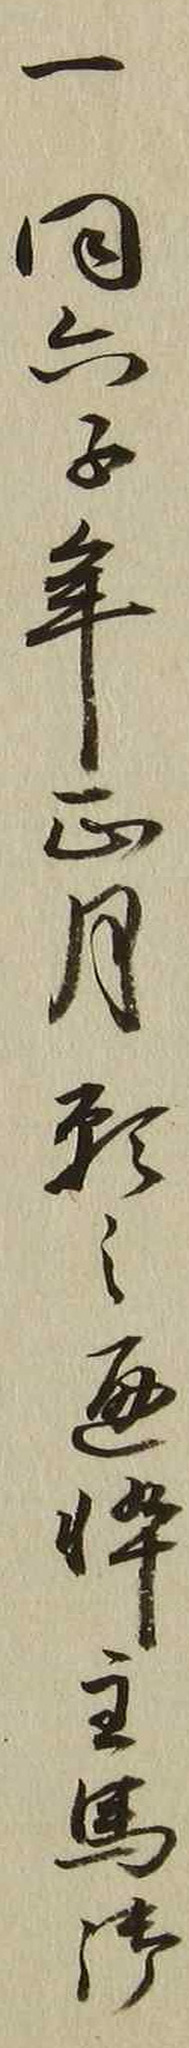一同六子年正月願之通忰主馬御
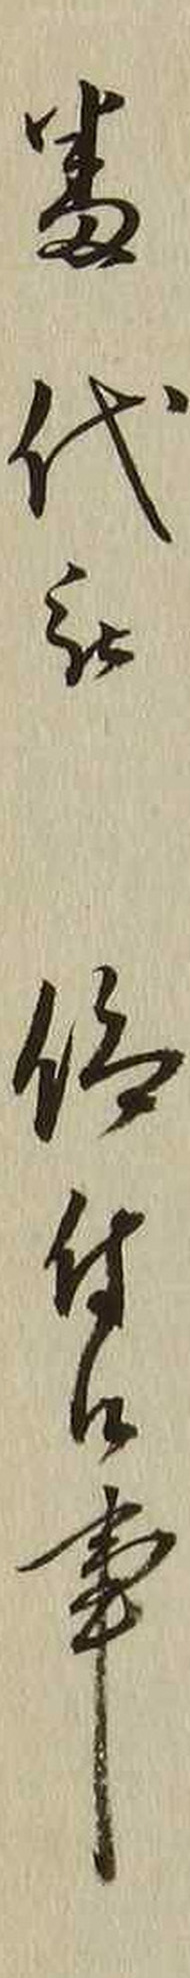番代被仰付候事
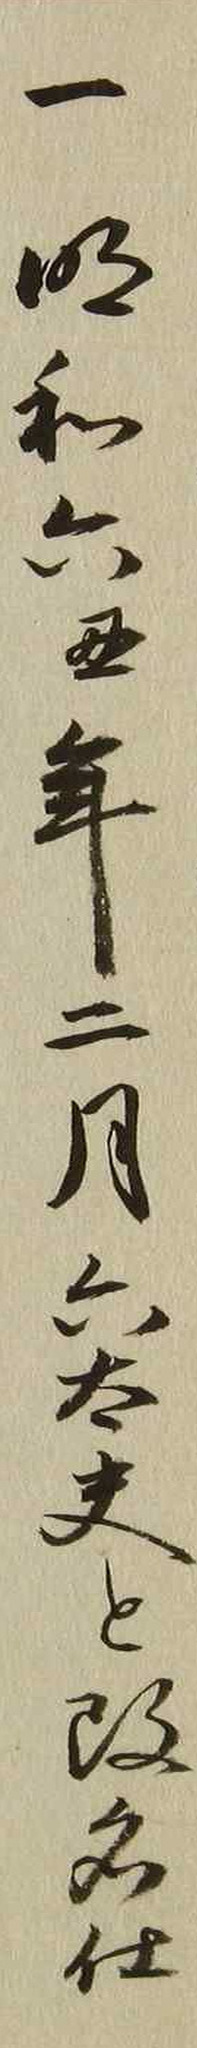一明和六丑年二月六太夫と改名仕
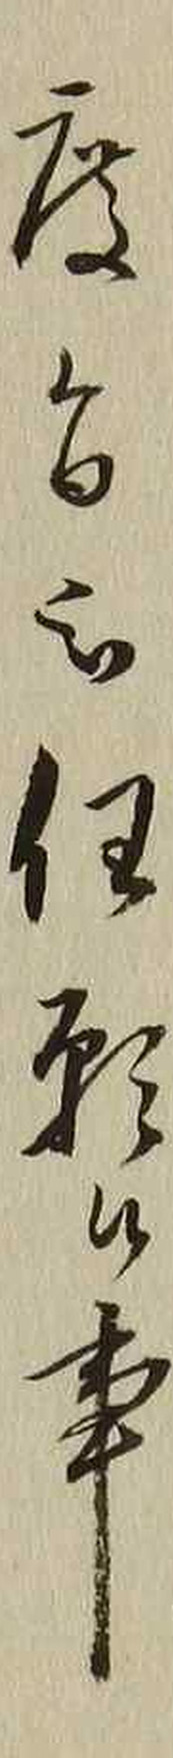度旨被任願候事
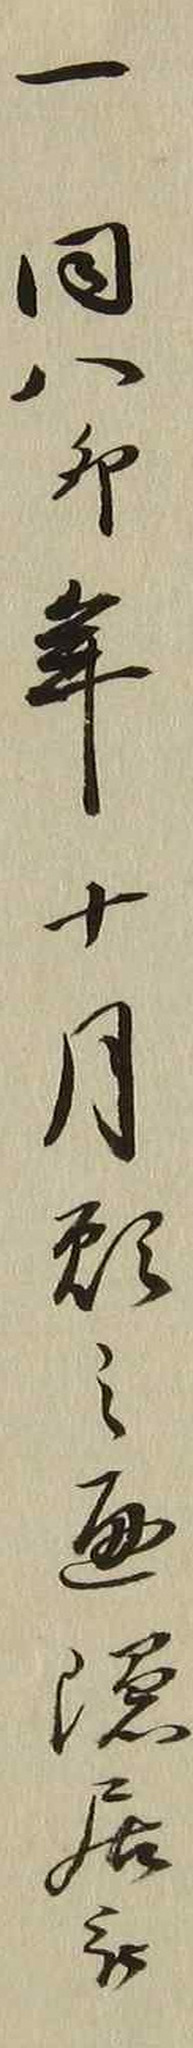一同八卯年十月願之通隠居被
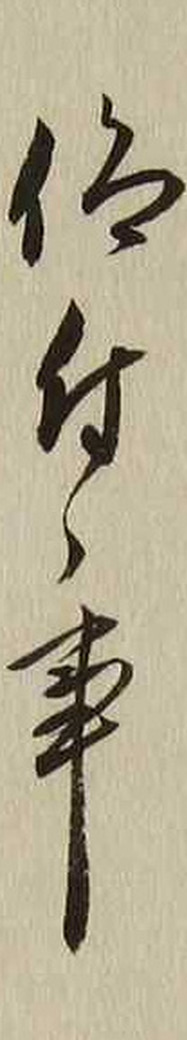仰付候事
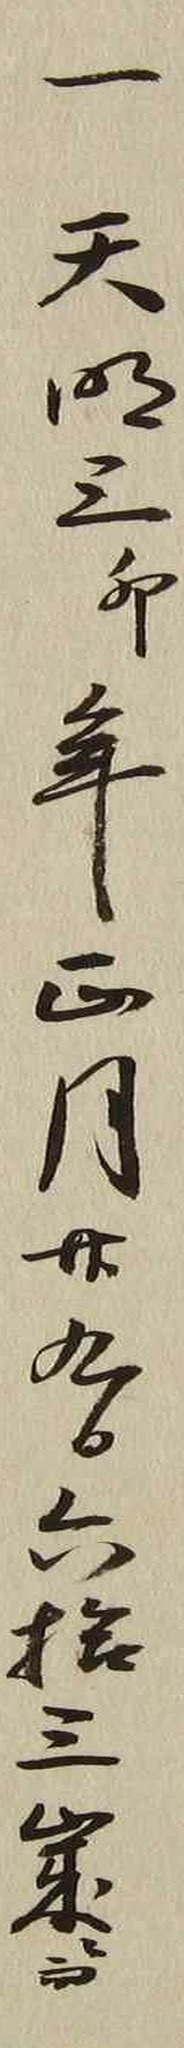一天明三卯年正月廿九日六拾三歳ニ而
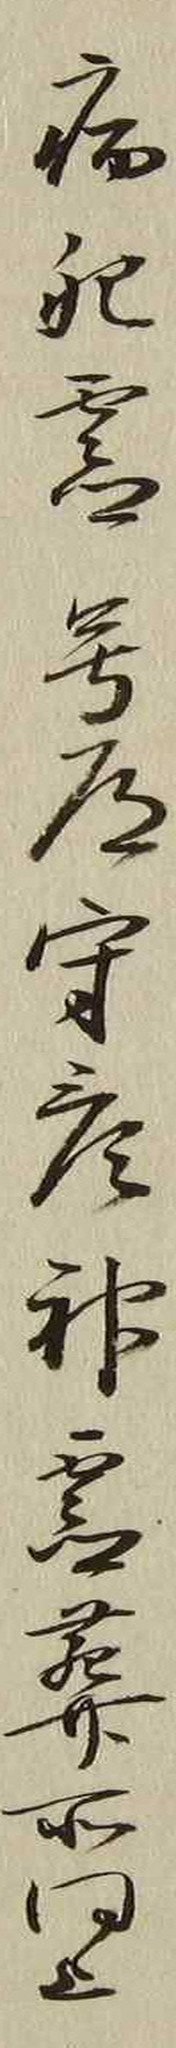病死霊号道守彦神霊葬所同上
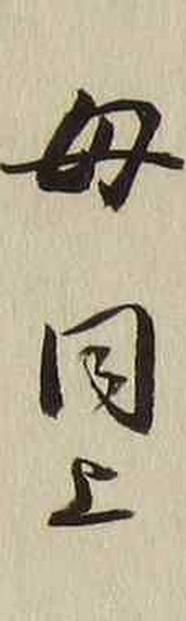母同上

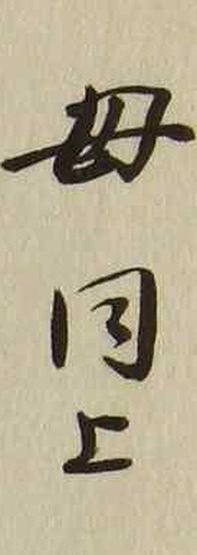母同上
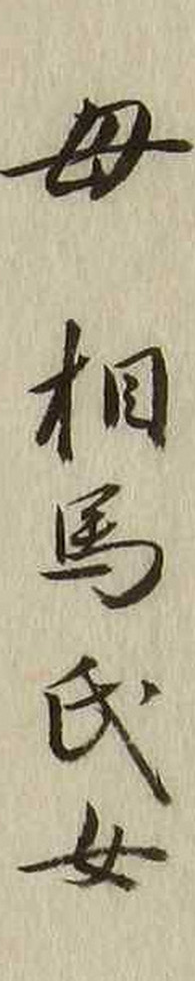母相馬氏女
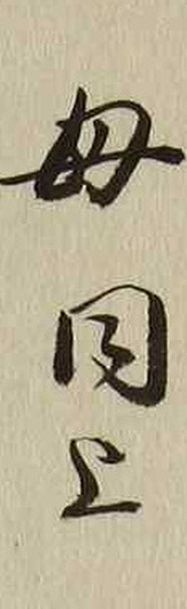母同上
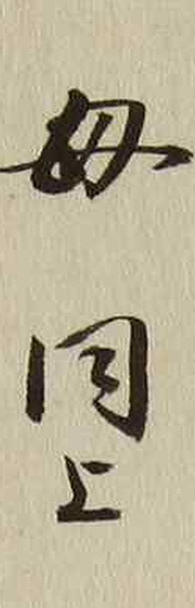母同上
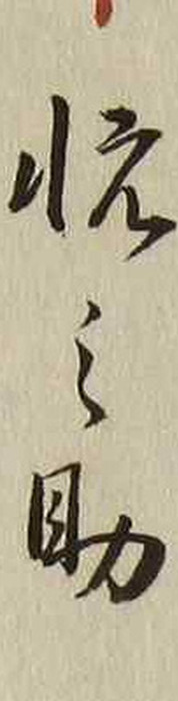悦之助
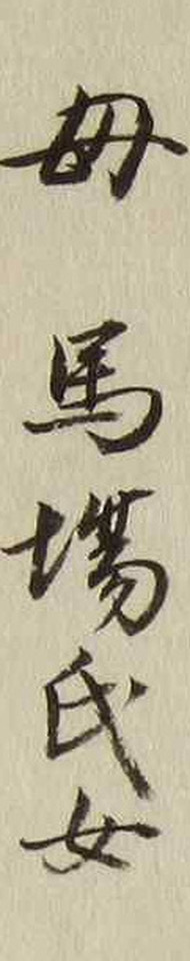母馬場氏女

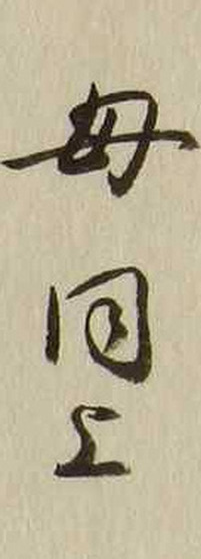母同上
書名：諸士系譜　巻之69　を之部3
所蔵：会津若松市立会津図書館
